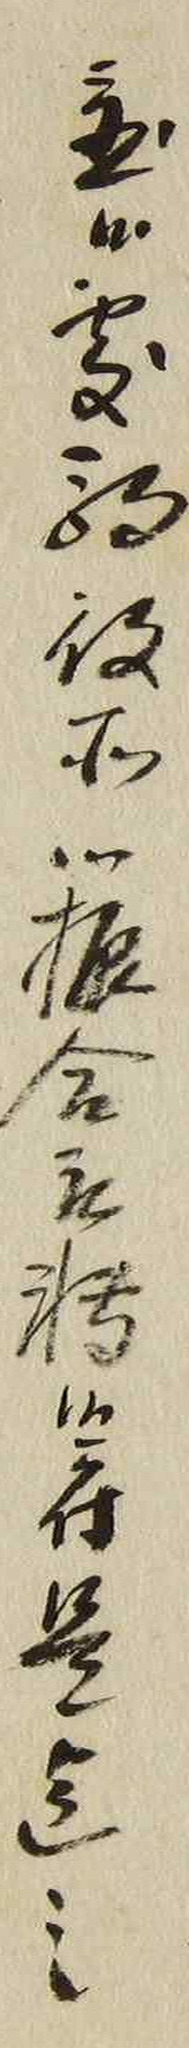置候処駒役所御振合を転候ニ付是迄之
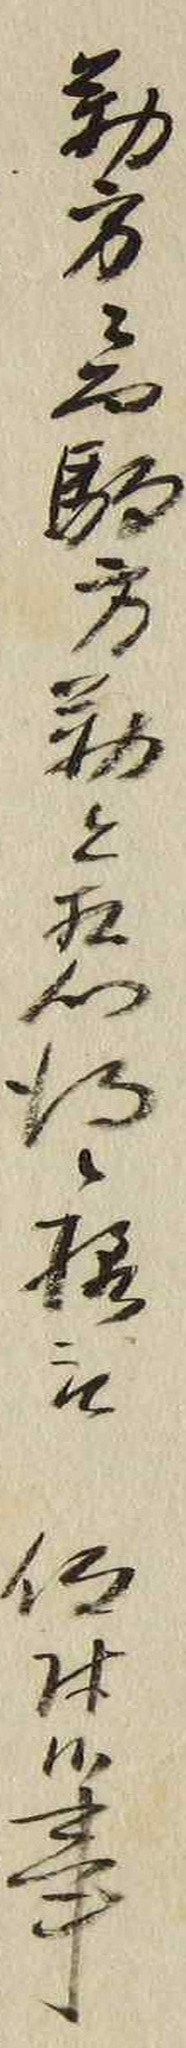勤方ニ而駒方勤と相心得候様被仰付候事
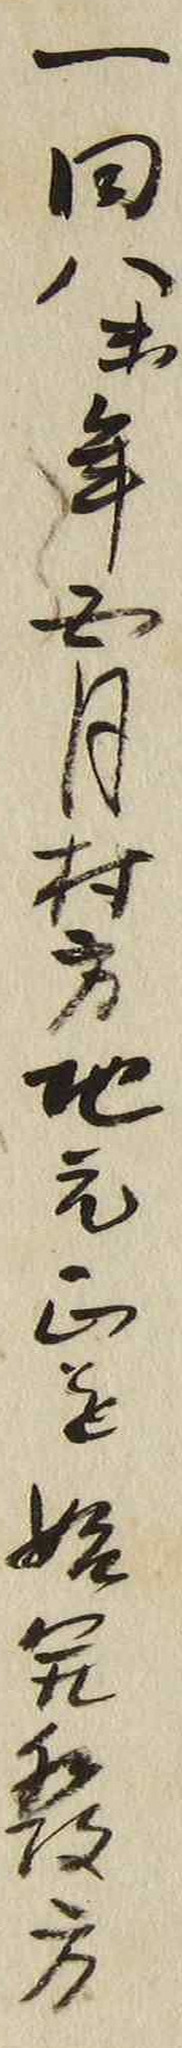一同ハ未年五月村方地元正を始開発方
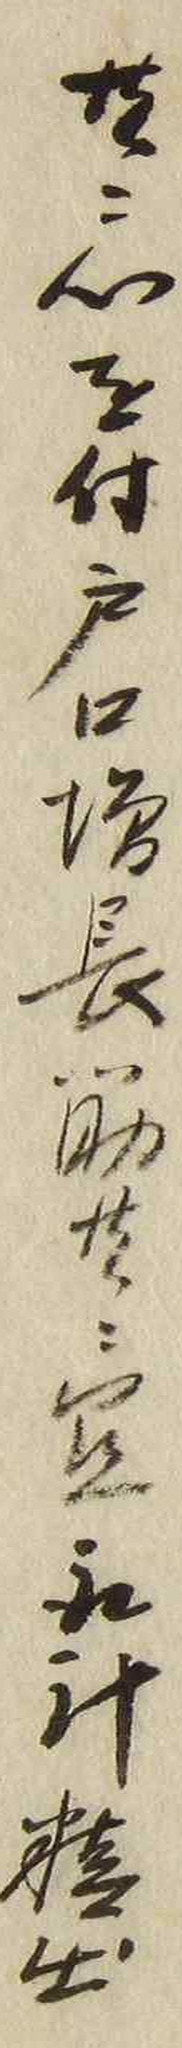共に心を付戸口増長筋共ニ宜取計精出

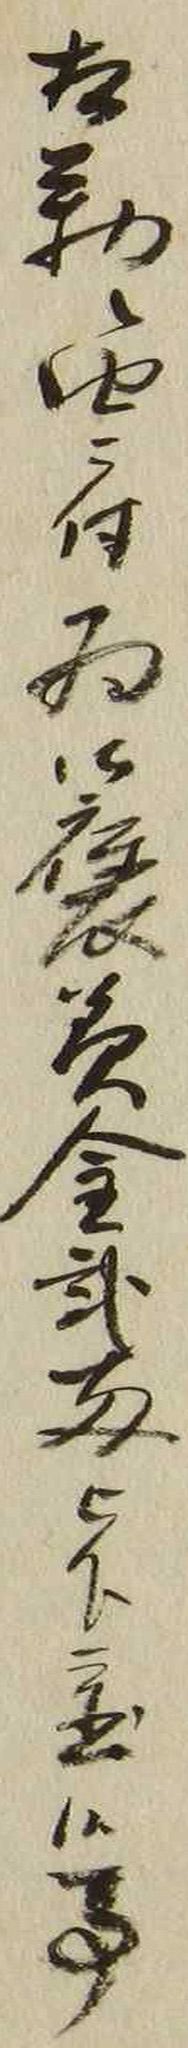相勤候由ニ付為御褒美金弐両被下置候事
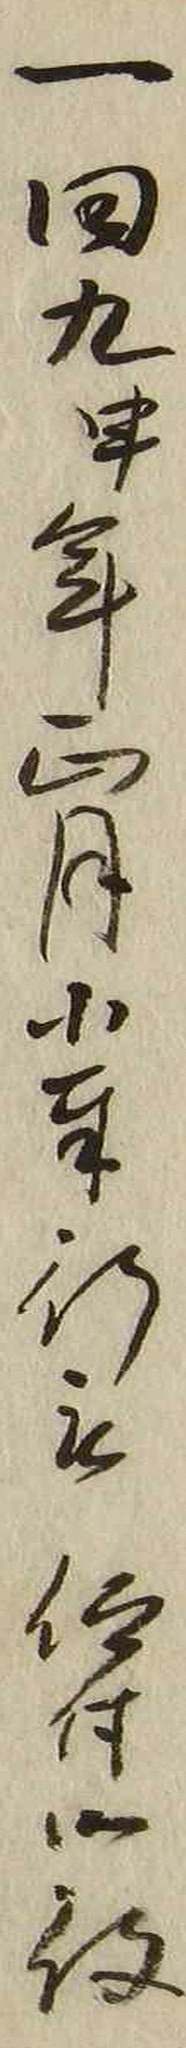一同九申年正月小奉行被仰付御役
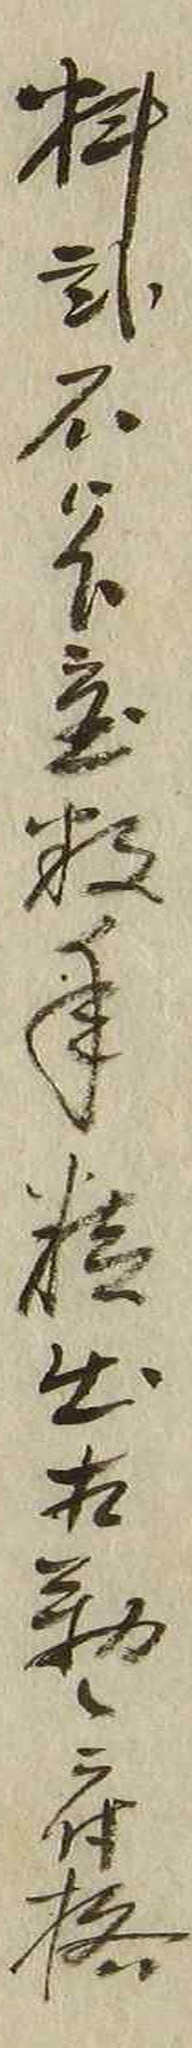料弐石被下置数年精出相勤候ニ付格
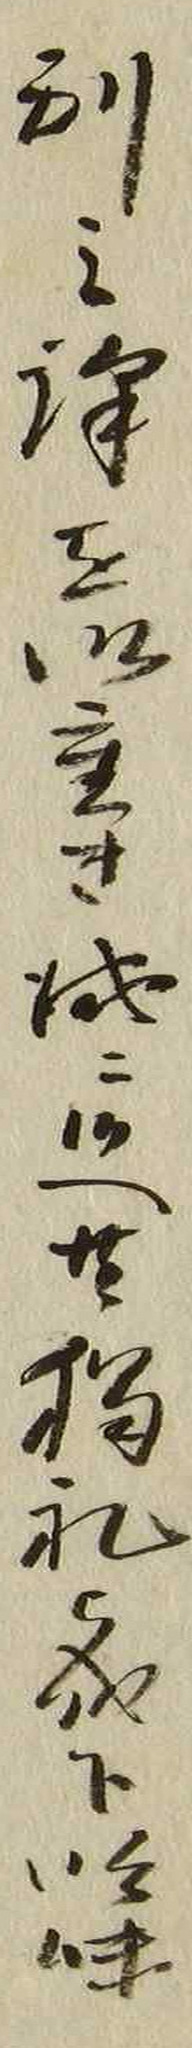別之訳を以御重き儀ニ候へ共独礼被成下吟味
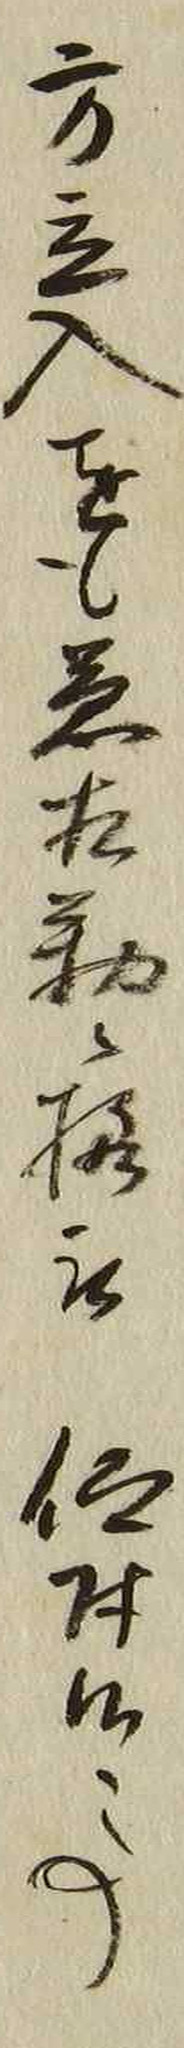方立入をも兼相勤候様被仰付候事
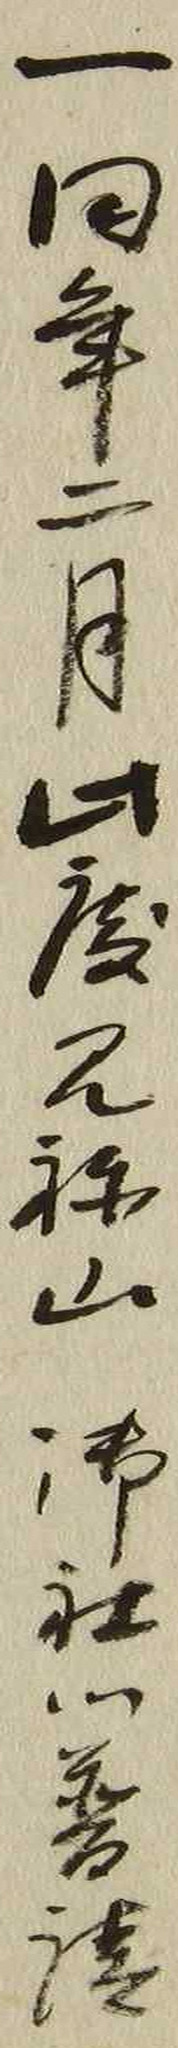一同年二月此度見称山御社御普請
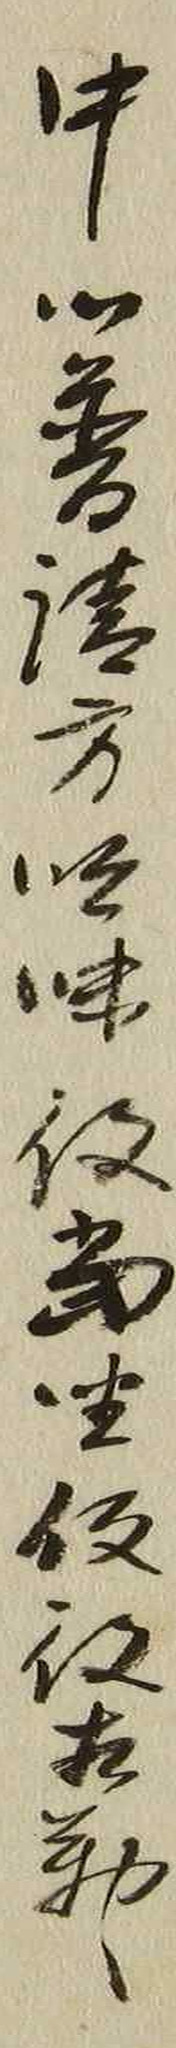中御普請方吟味役当坐仮役相勤候
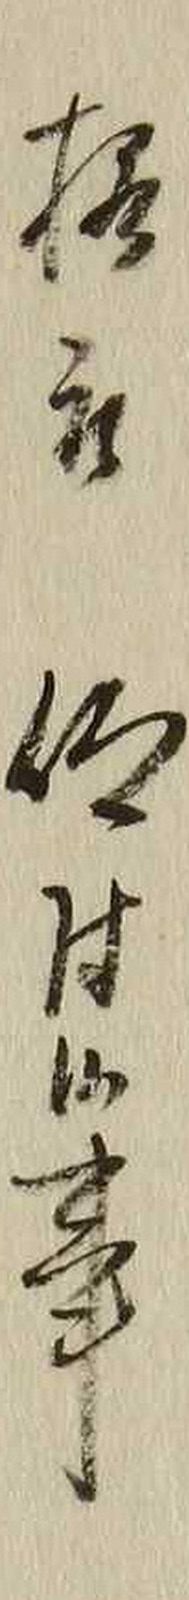様被仰付候事
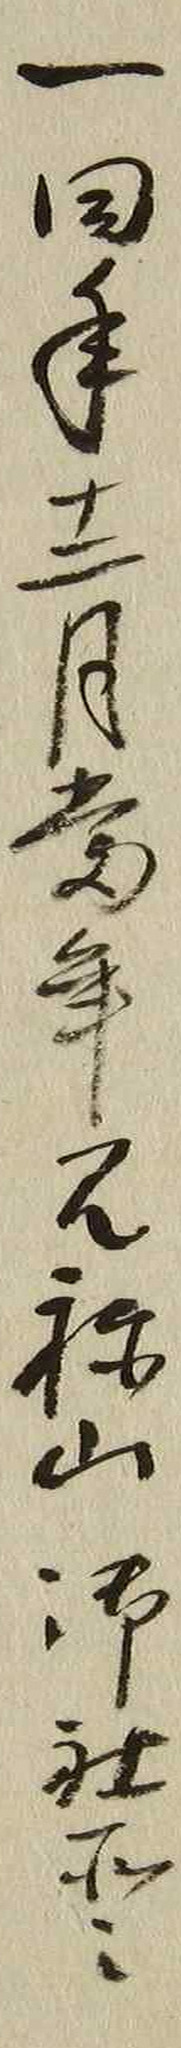一同年十二月当年見称山御社所々
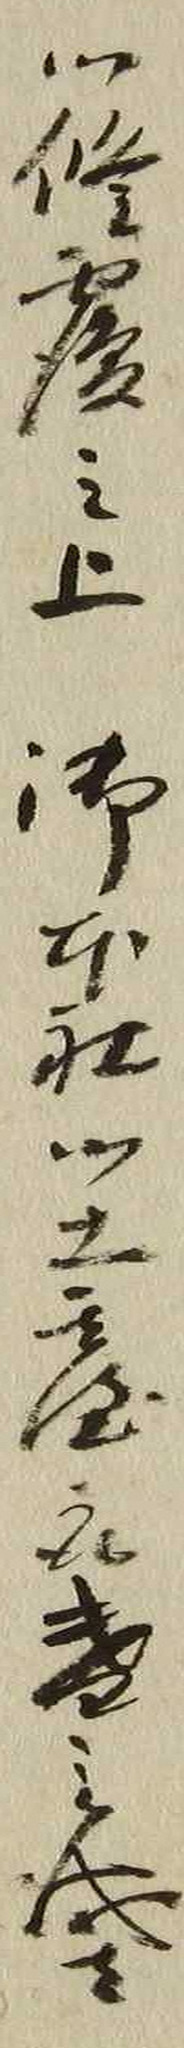御修覆之上御本社御土台取替之儀は
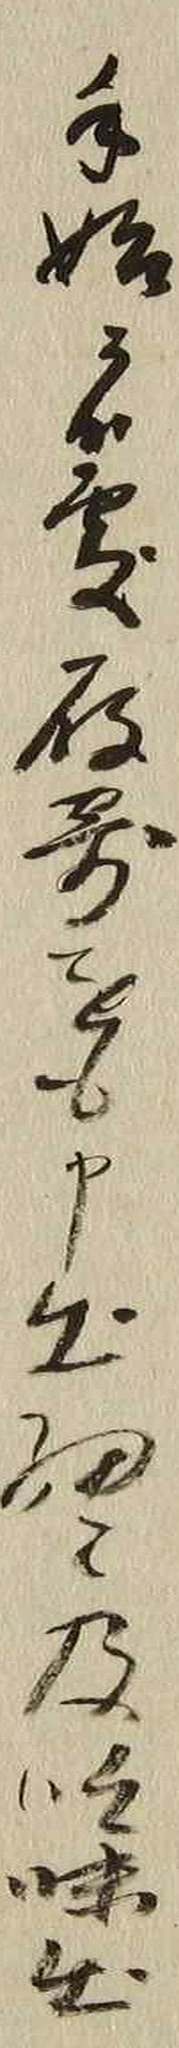手始ニ候処存寄をも申出細々及吟味出
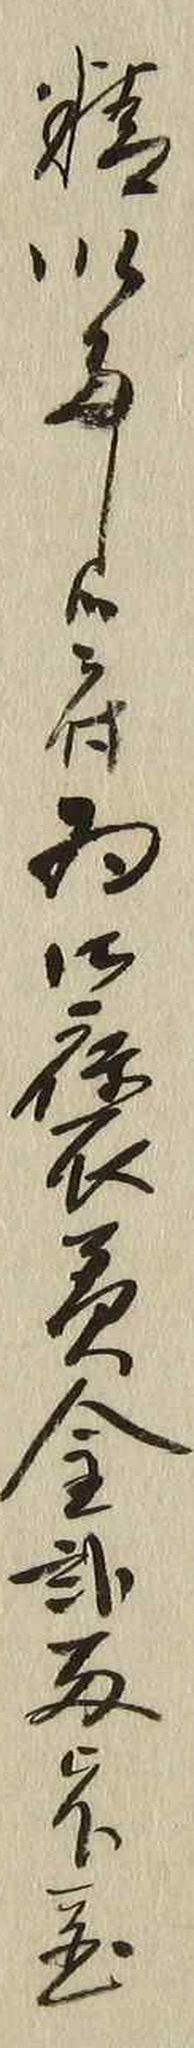精いたし候ニ付為御褒美金弐両被下置
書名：諸士系譜　巻之360　す之部10
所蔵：会津若松市立会津図書館
